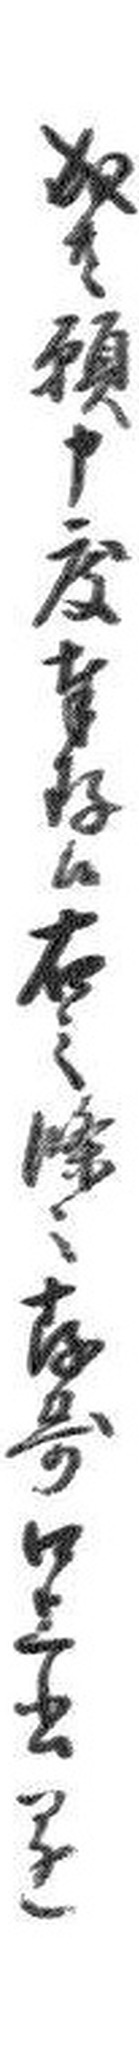成共願申度奉存候右之条々存寄口上書懸

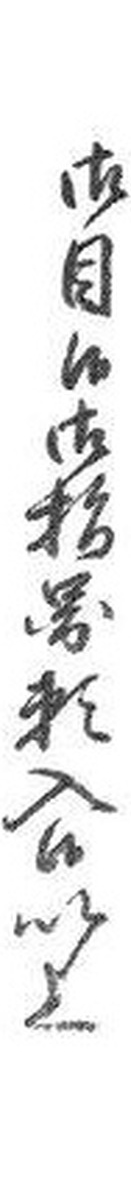御目候御指図頼入候以上
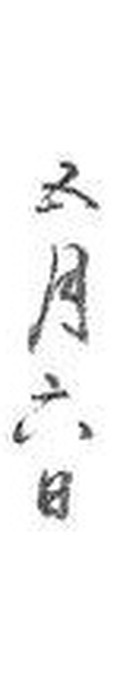五月六日
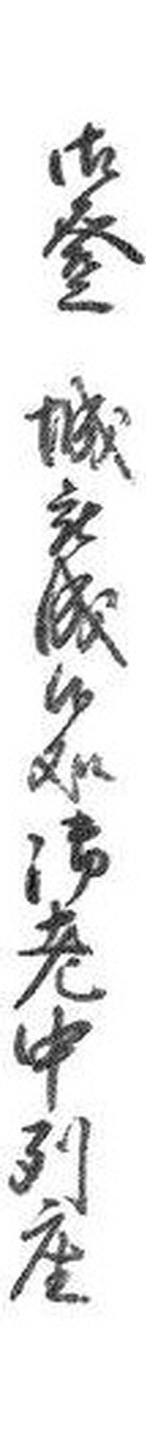御登城被成候処御老中列座
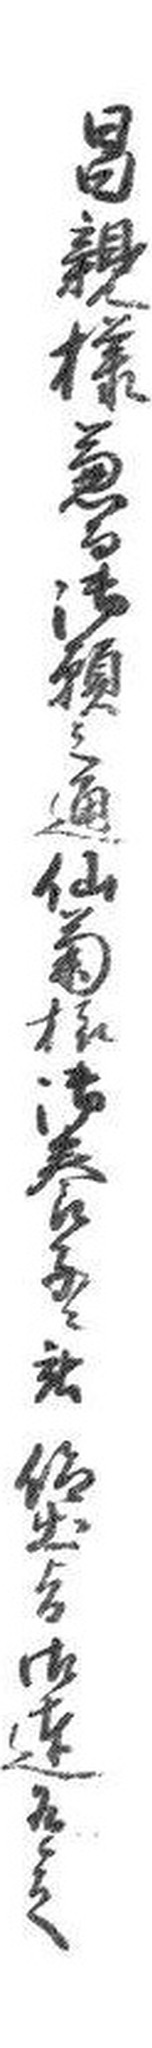昌親様兼而御頼之通仙菊様御養子ニ被仰出旨御達有之
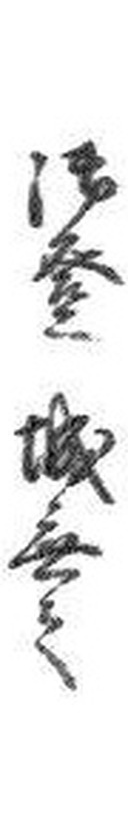御登城無之
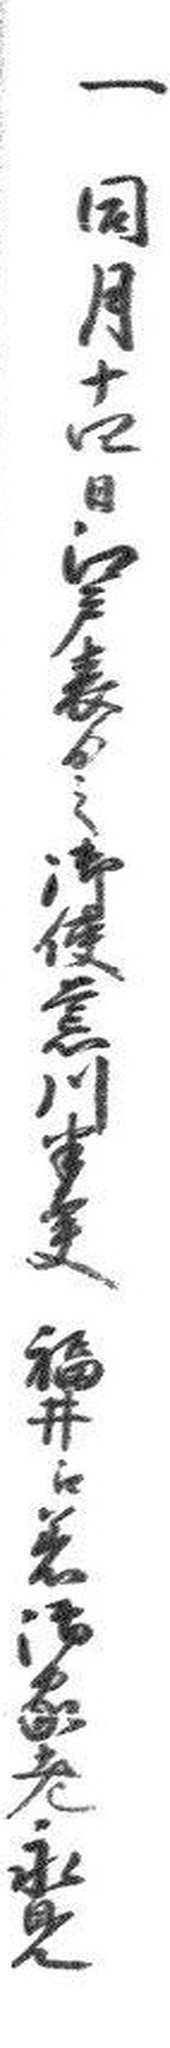一同月十四日江戸表ゟ之御使荒川半太夫福井江着御家老永見
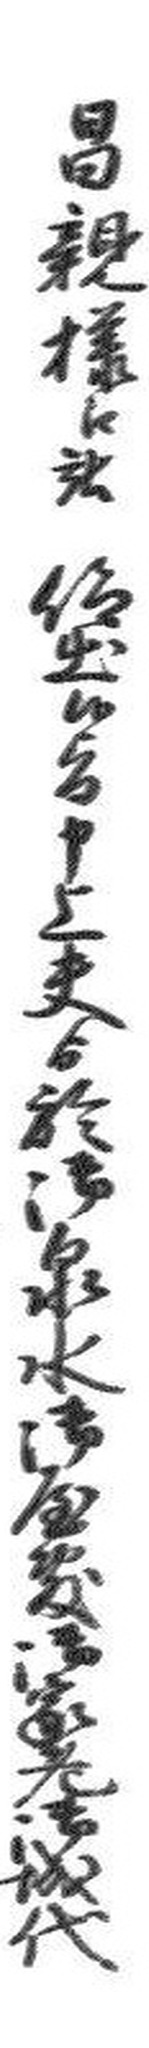昌親様江被仰出候旨申上夫ゟ於御泉水御屋敷御家老御城代
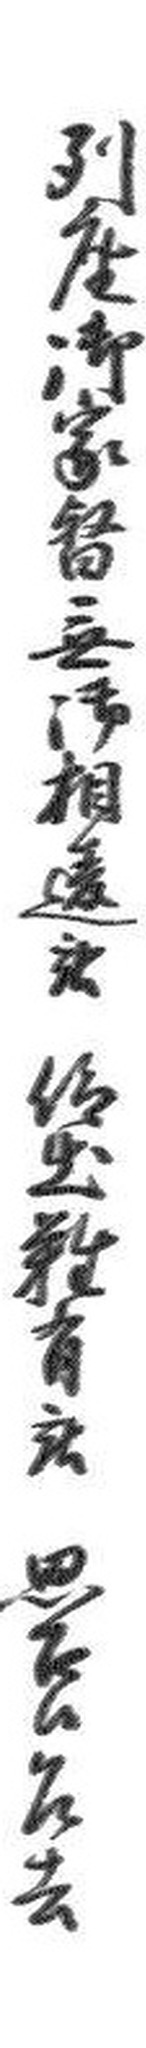列座御家督無相違被仰出難有被思召候乍去
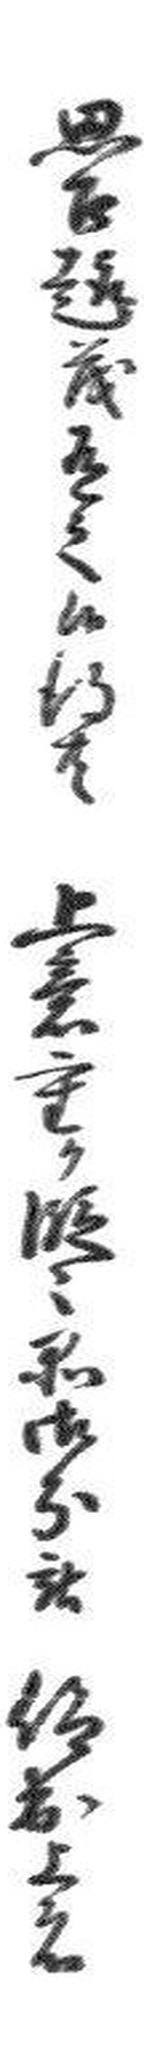思召趣茂有之候得共上意重ク段々御品御分被仰出上者
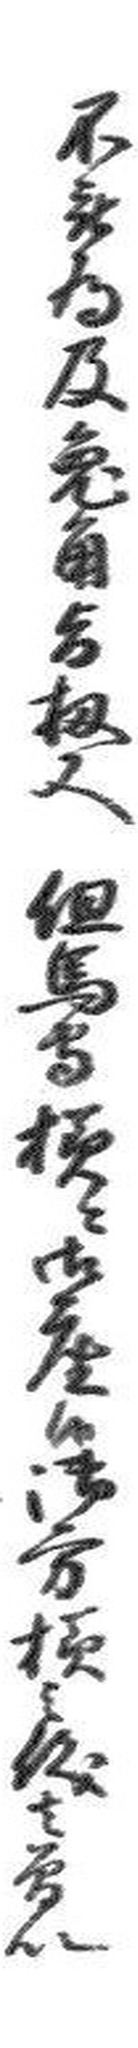不被及兎角旨扨又但馬守様ニ御座候御方様之儀者曽以
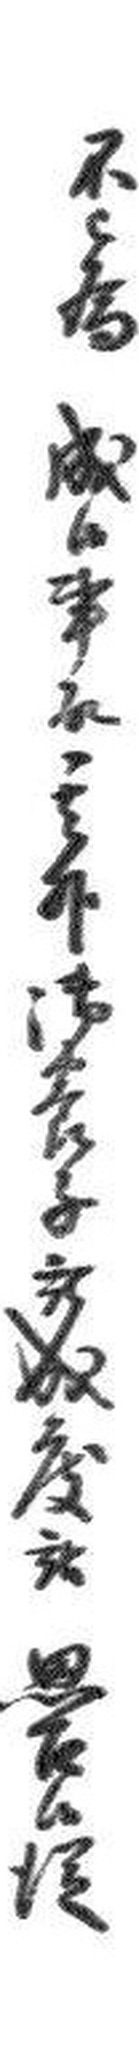不被為成候事故其外御養子被成度被思召候従
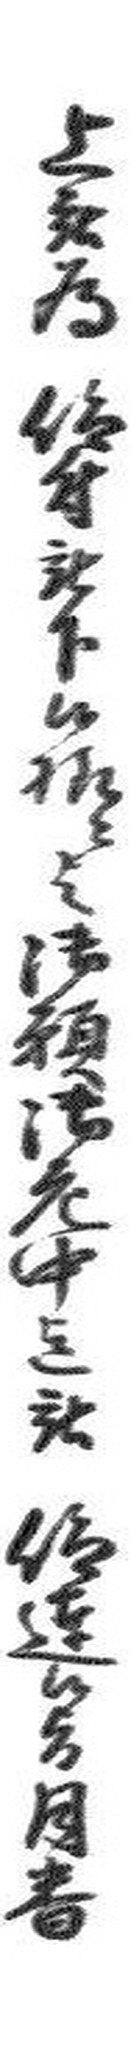上被為仰付被下候様ニ与御願御老中迄被仰達候旨月番

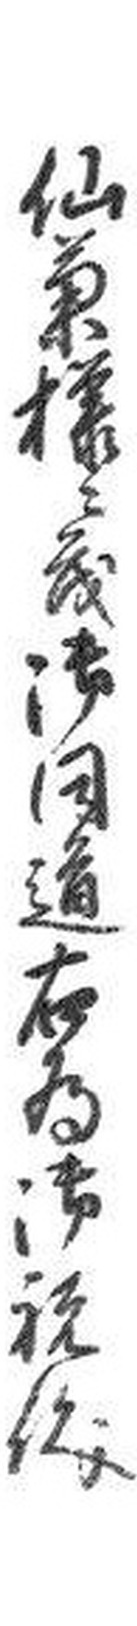仙菊様ニ茂御同道右為御祝儀
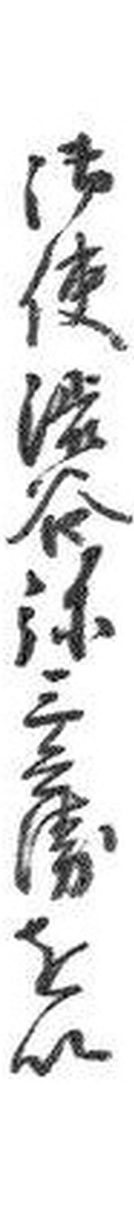御使渋谷弥三兵衛を以
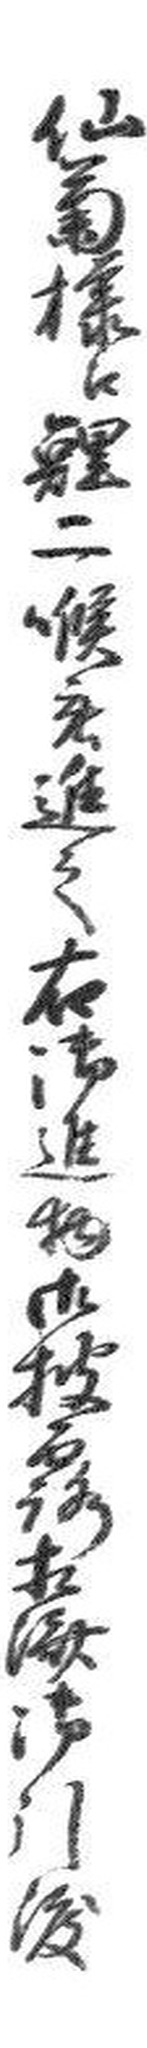仙菊様江鯉二喉被進之右御進物御披露相済御引渡
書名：家譜 十一 昌親公 従延宝二年到延宝四年八月
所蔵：福井県文書館 Fukui Prefectural Archives
